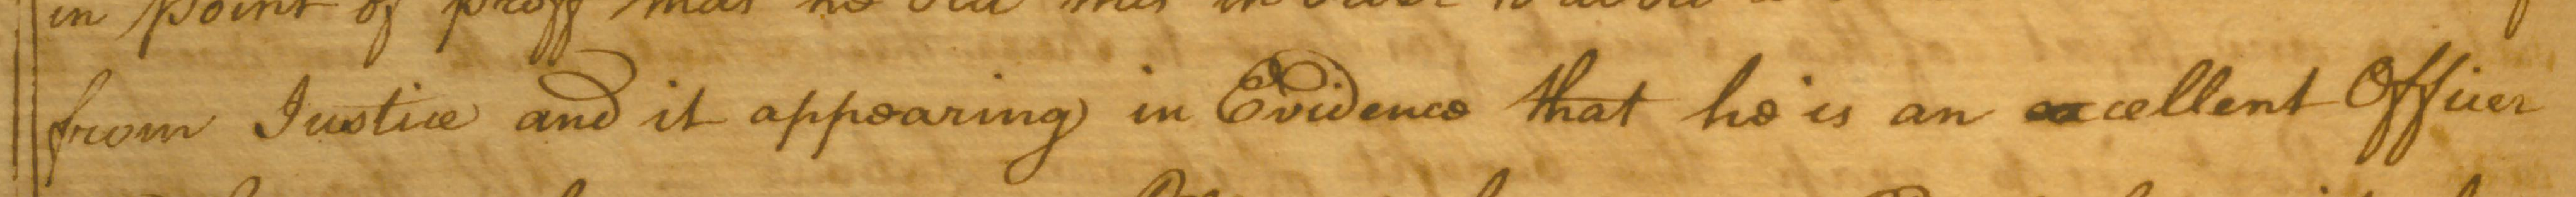from Justice and it appearing in Evidence that he is an excellent Officer
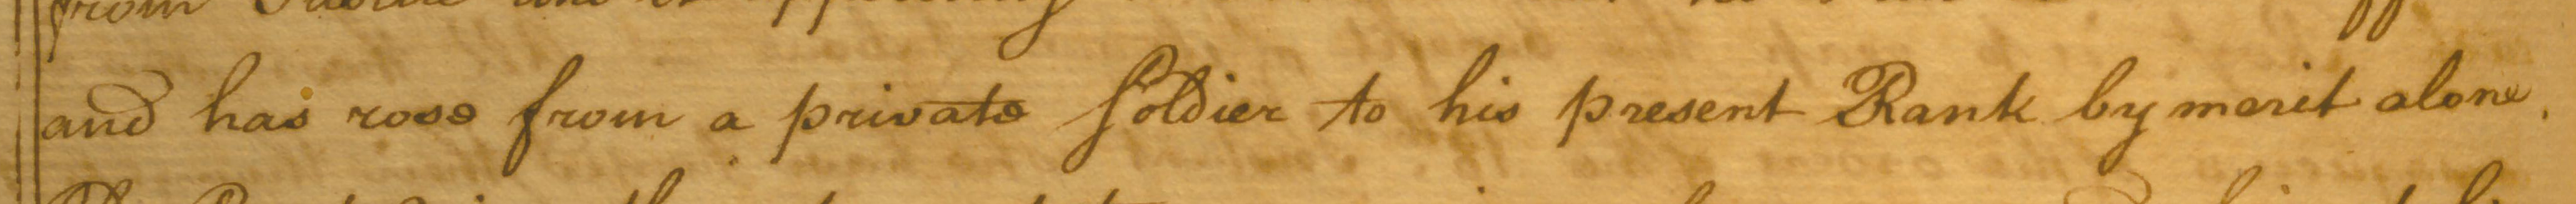and has rose from a private Soldier to his present Rank by merit alone.
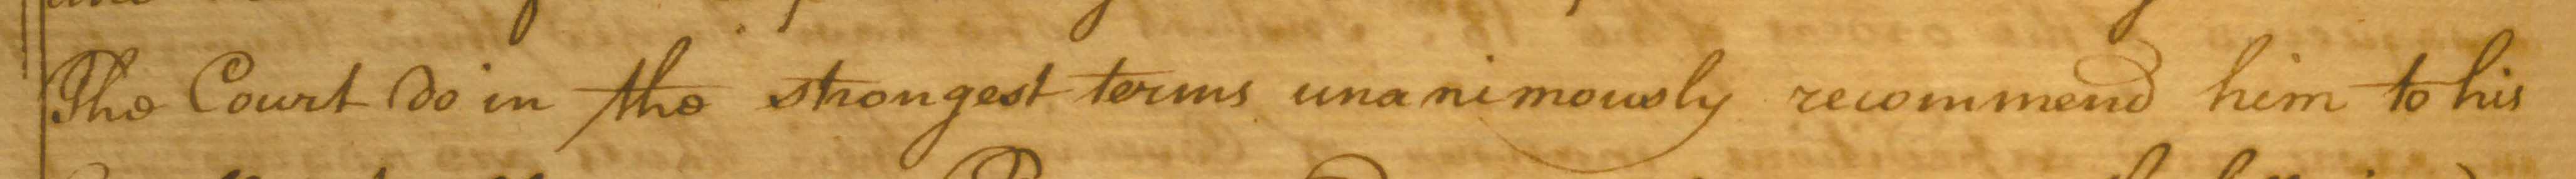The Court do in the strongest terms unanimously recommend him to his
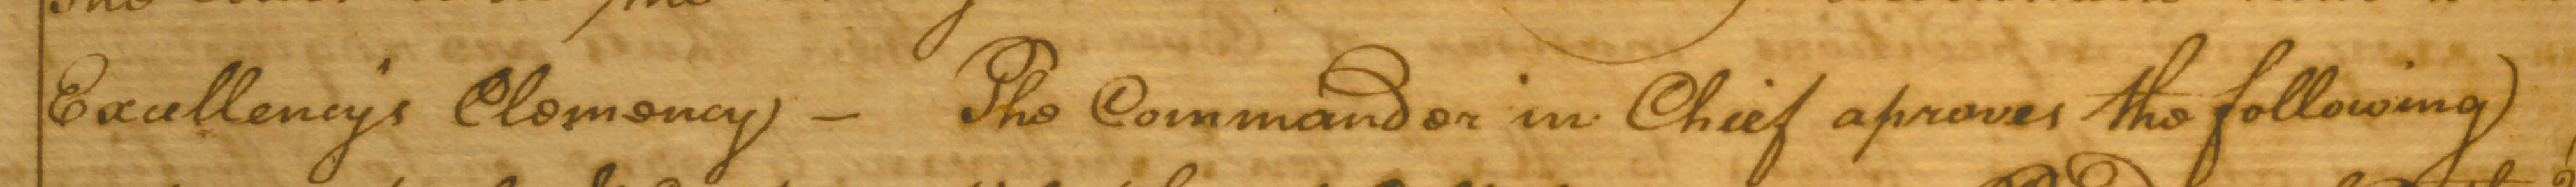Excellency's Clemency- The Commander in Chief aproves the following
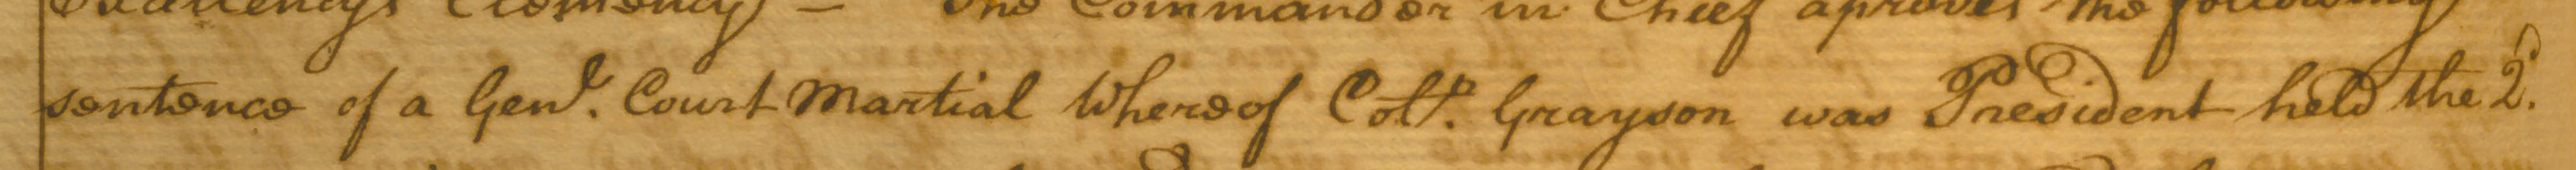sentence of a Gen^l. Court Martial whereof Col^o. Grayons was President held the 2^d.
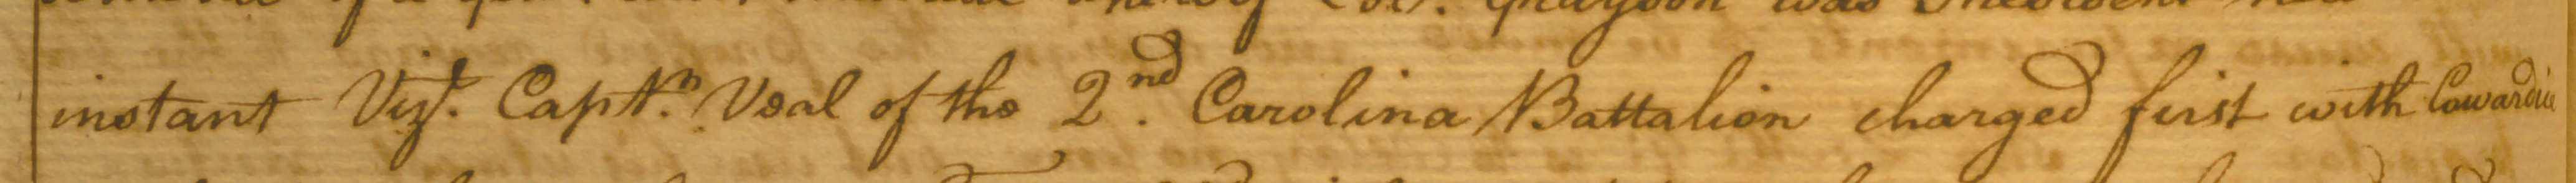instant Viz^t. Capt^n. Veal of the 2^nd. Carolina Battalion charged first with Cowardice
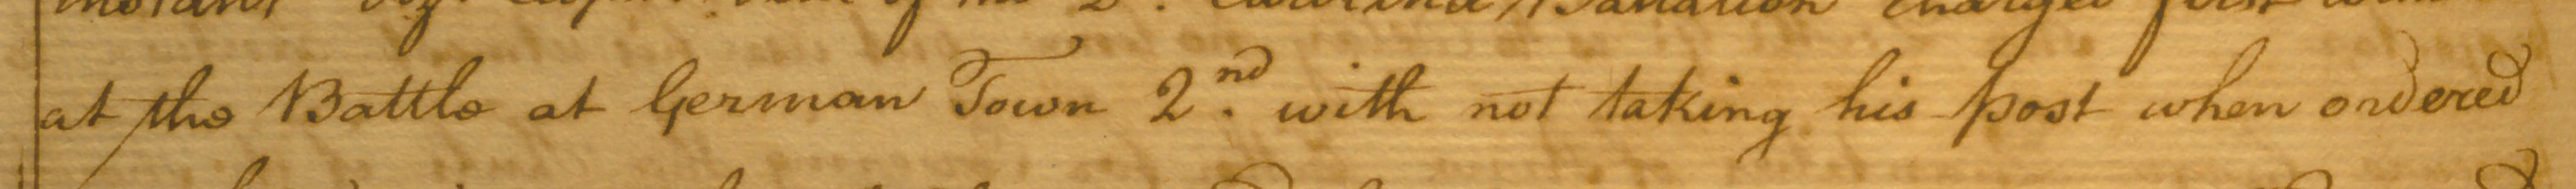at the Battle of German Town 2^nd. with not taking his post when ordered
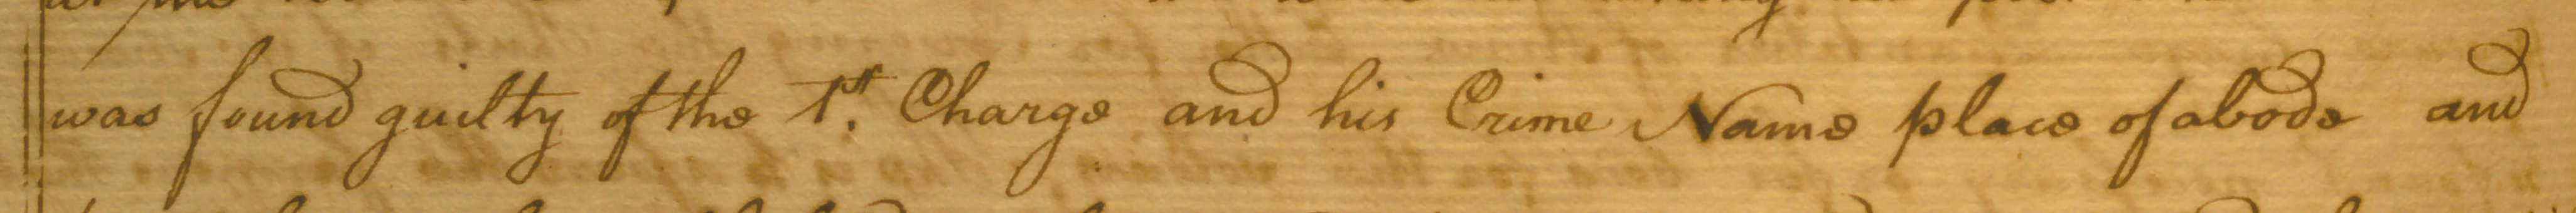was found guilty of the 1^st. Charge and his Crime Name place of abode and
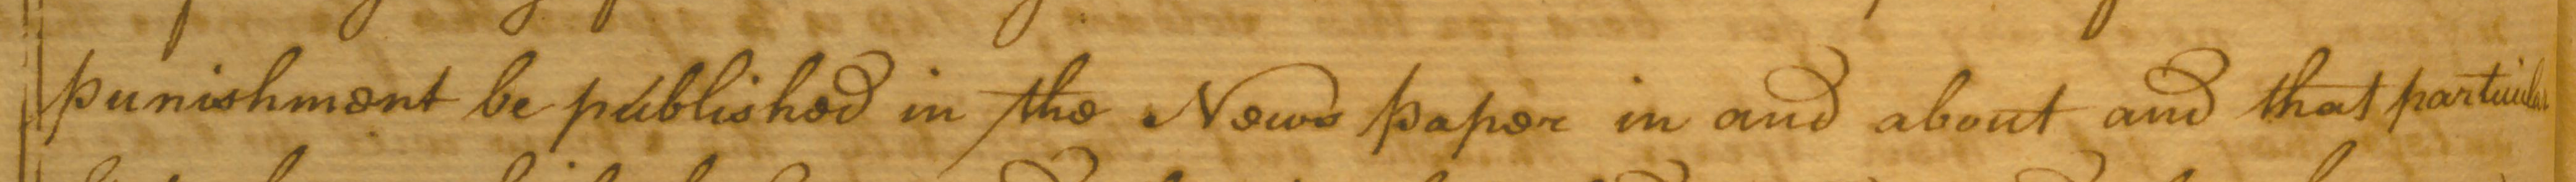punishment be published in the News paper in and about and that particular
